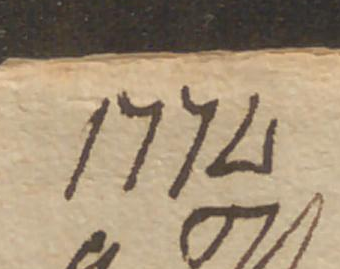1774
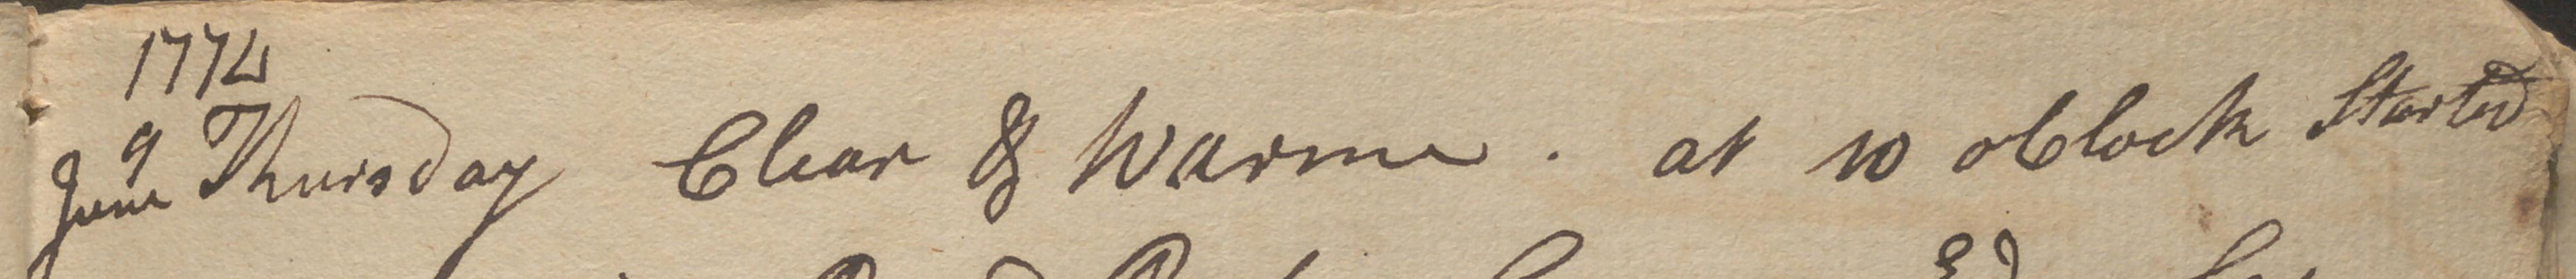June ^9 Thursday Clear & Warme. at 10 oClock Started
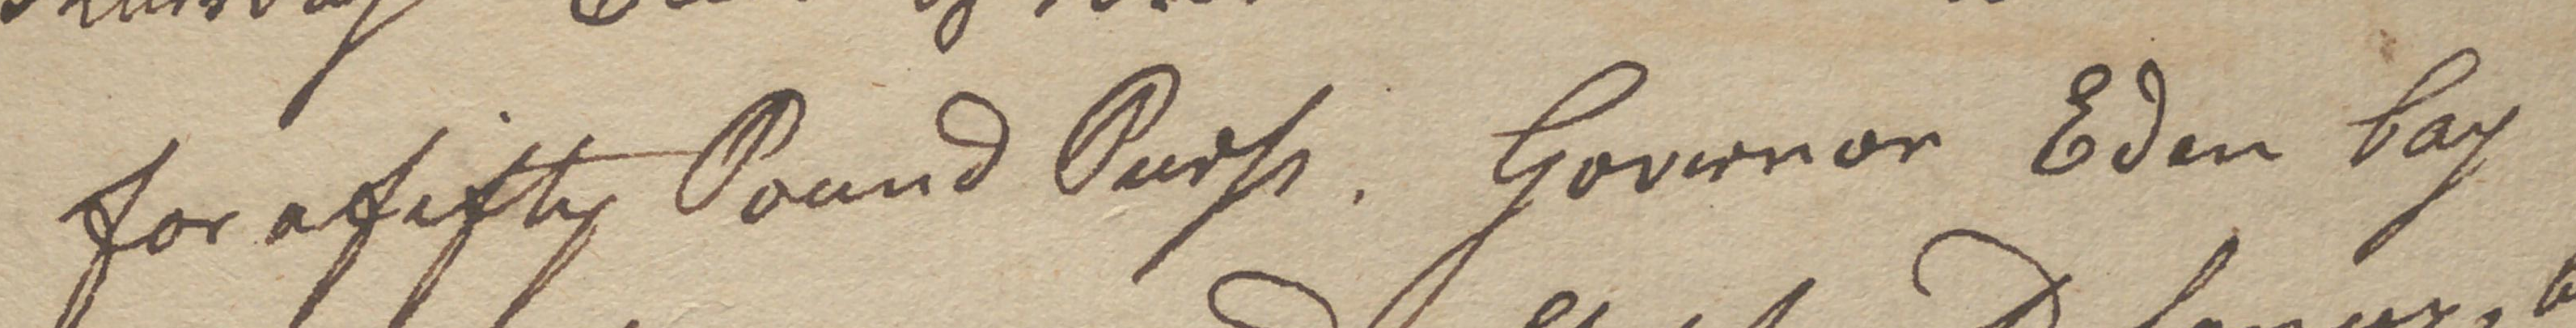for a fifty Pound Purss. Governor Eden bay
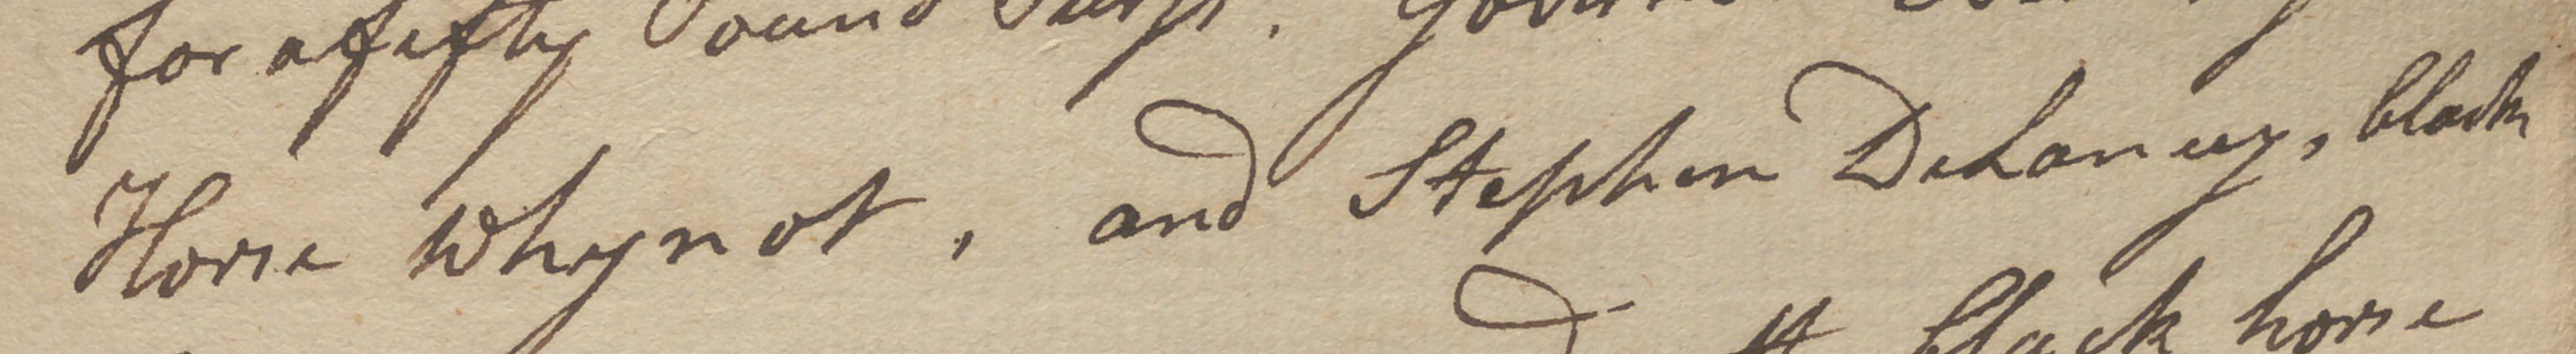Horse why not, and Stephen DeLancey, black
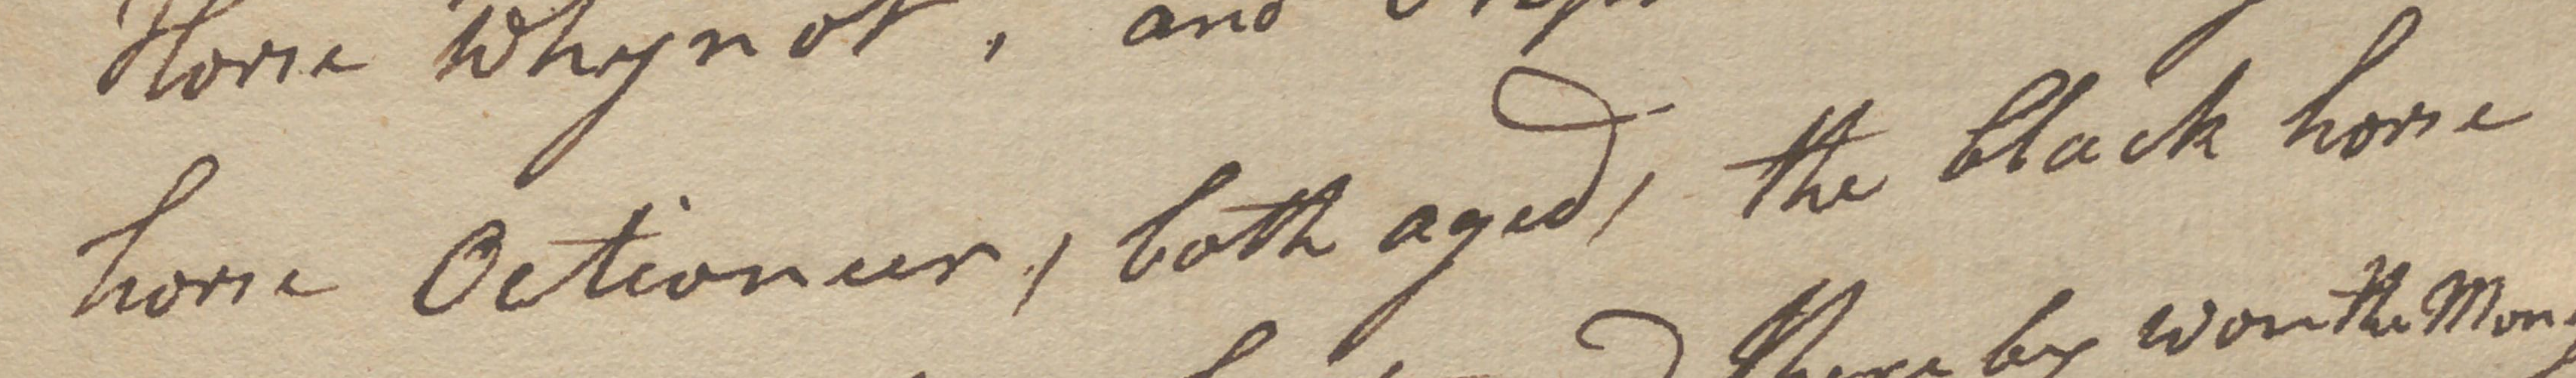horse Octioneer, both aged, the black horse
